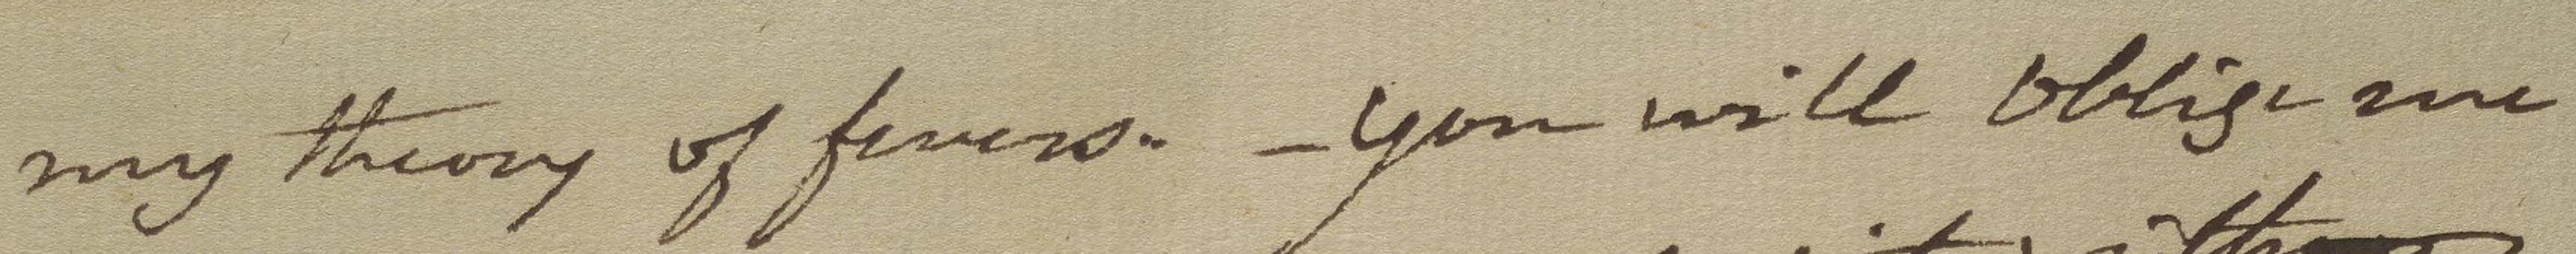my theory of fevers. you will oblige me
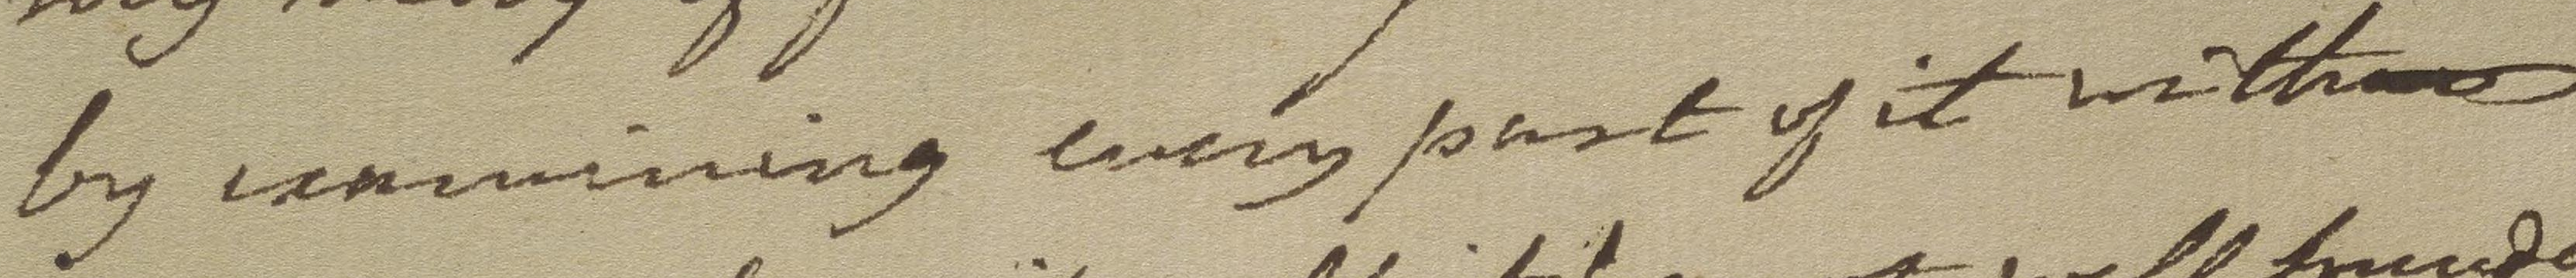by examining every part of it with[ou]
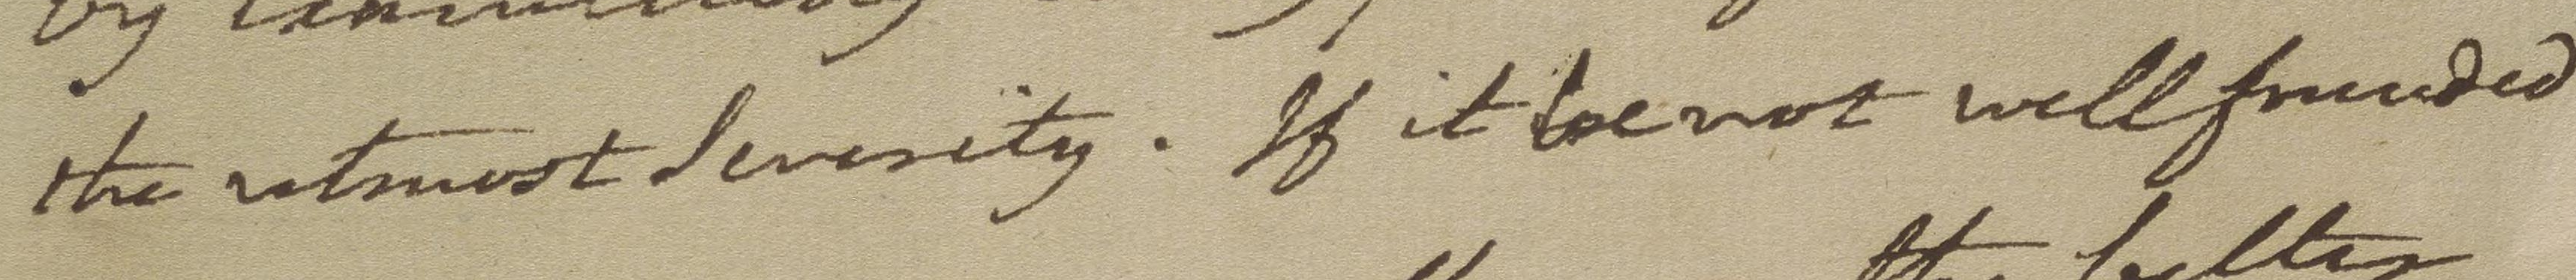the utmost severity. If it be not well founded
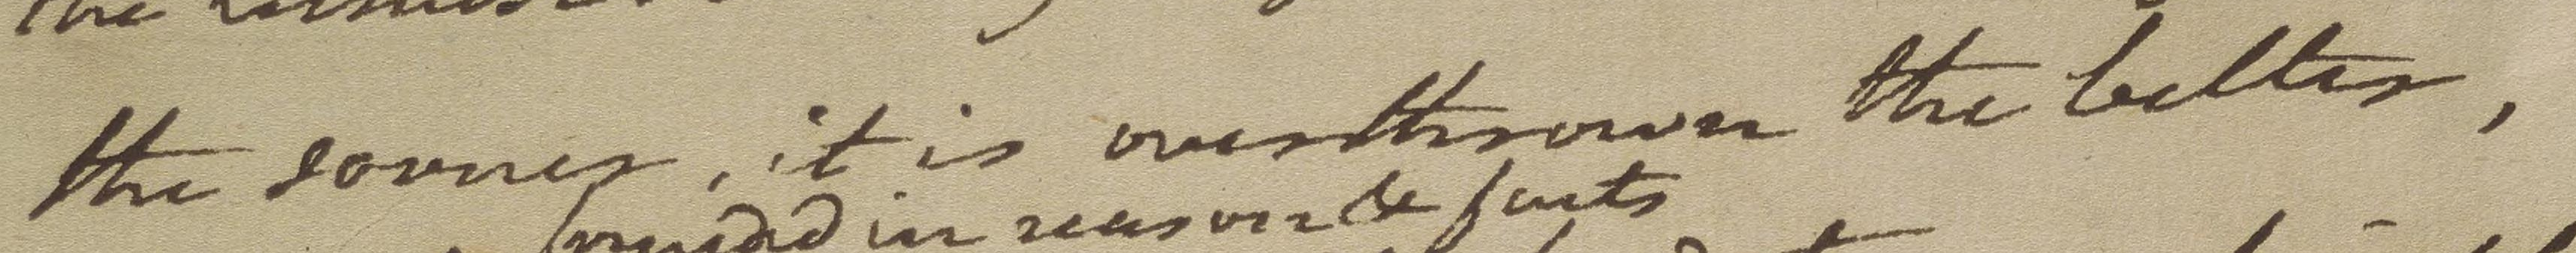the souner, it is overthrown the better,
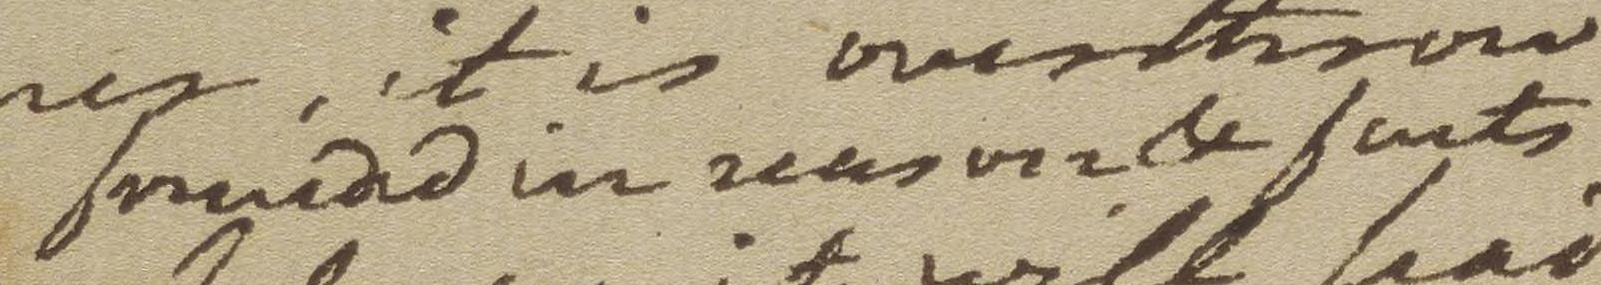founded in reasonable facts
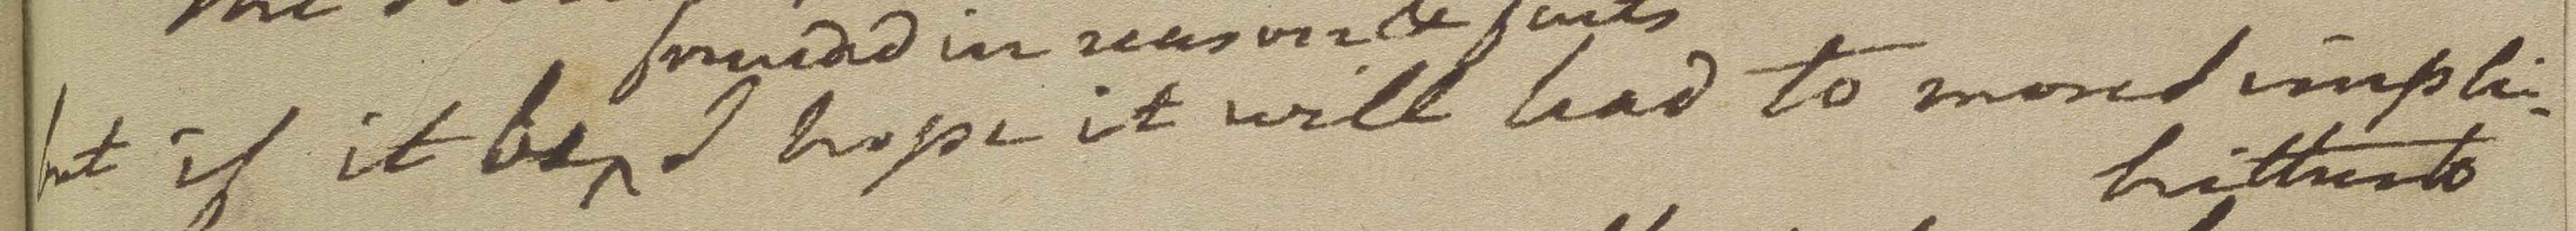but if it be ^ I hope it will had to more simpli-
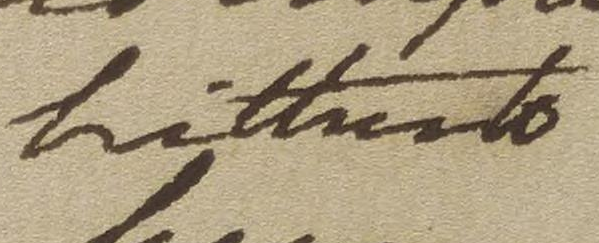hitherto
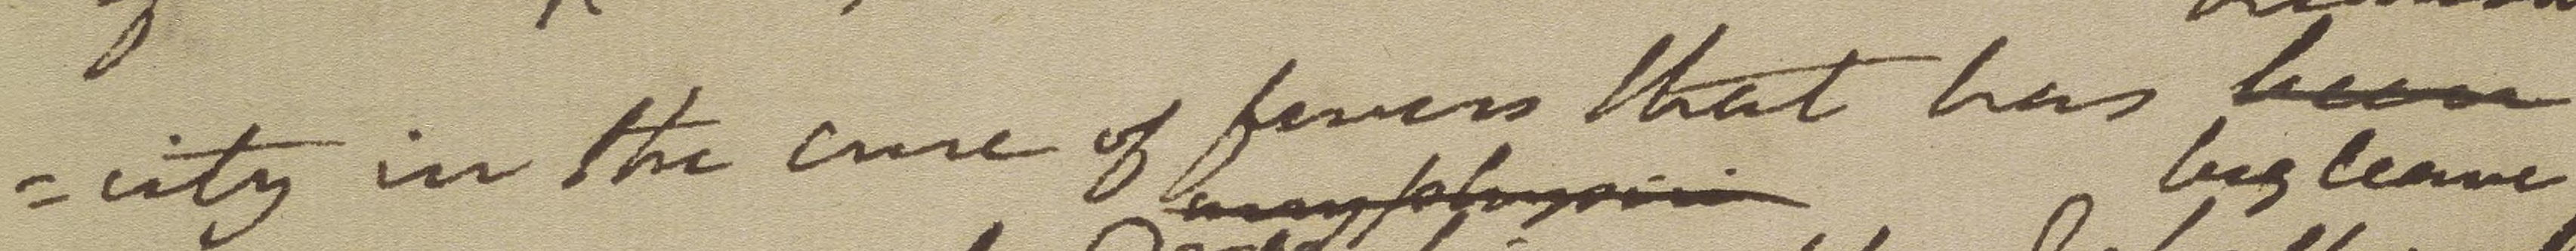-city in the care of fevers that has [been]
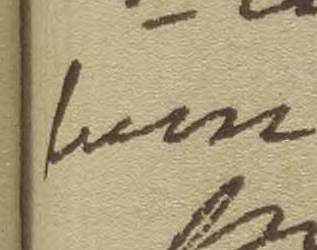been
